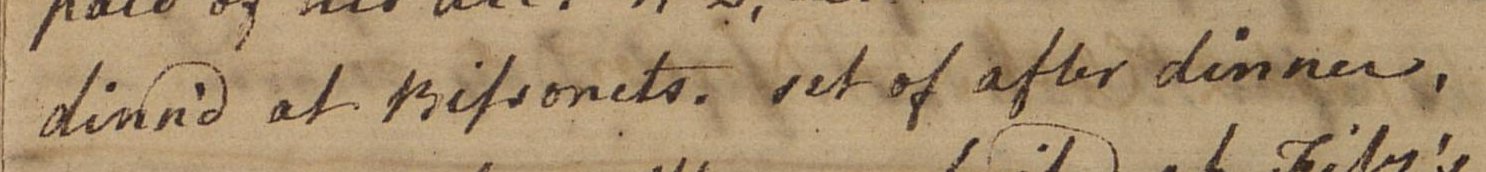dinn'd at Bissonets. set of after dinner,
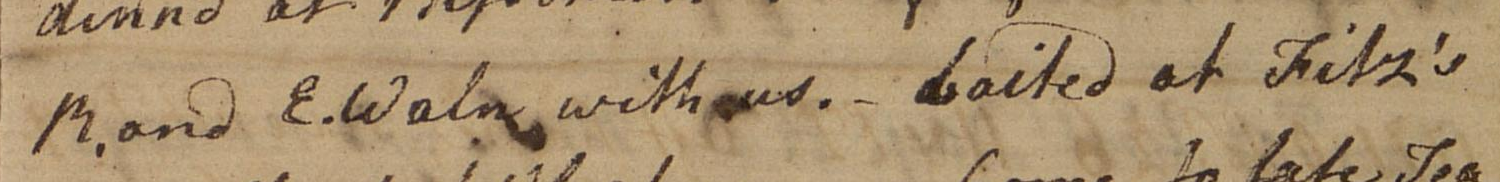R. and E. Waln with us.- Caited at Fitz's
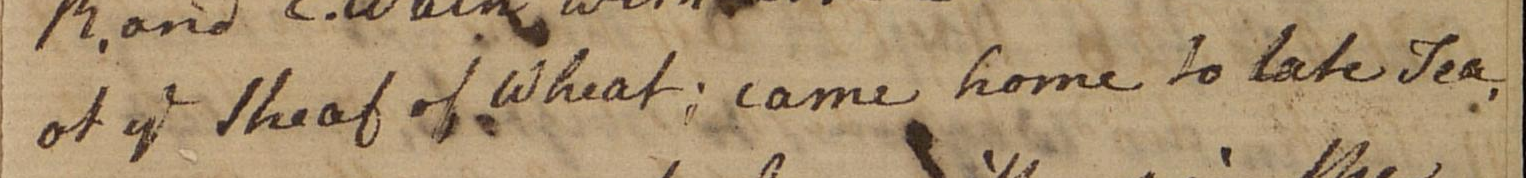at y^e Sheaf of Wheat; came home to late Tea,
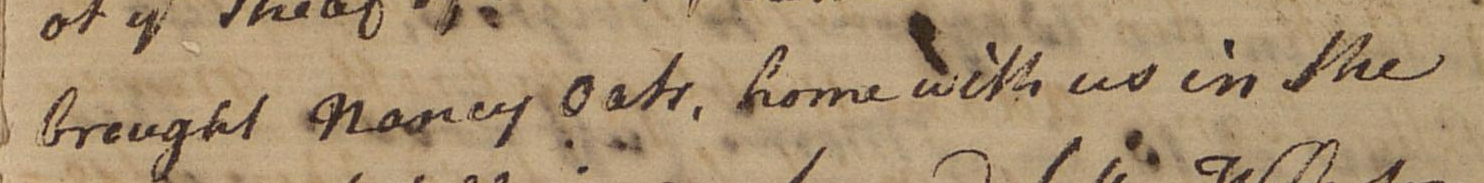braught Nancy Oats, home with us in the
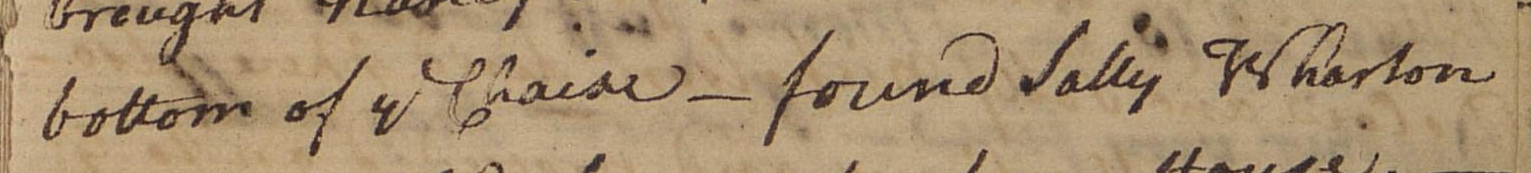bottom of y^e Chaise- found Sally Wharton
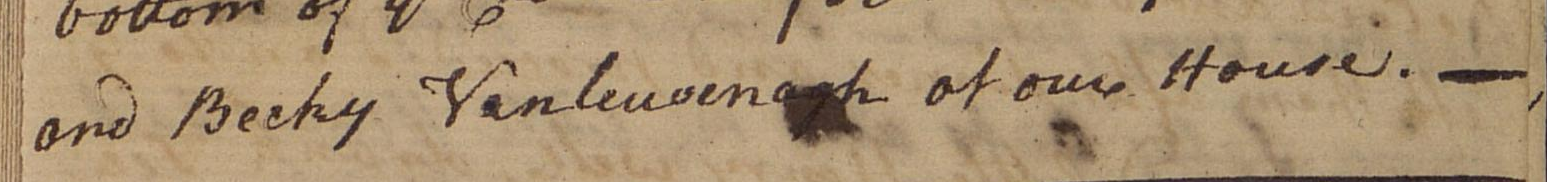and Becky Vanteurenash? at our House.-
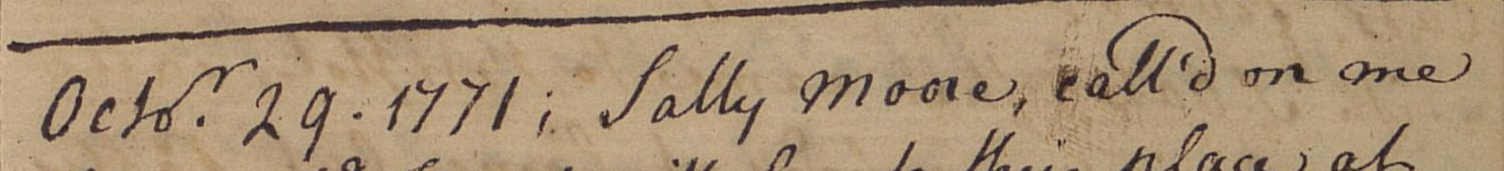Octo^r. 29^. 1771; Sally Moore, call'd on me
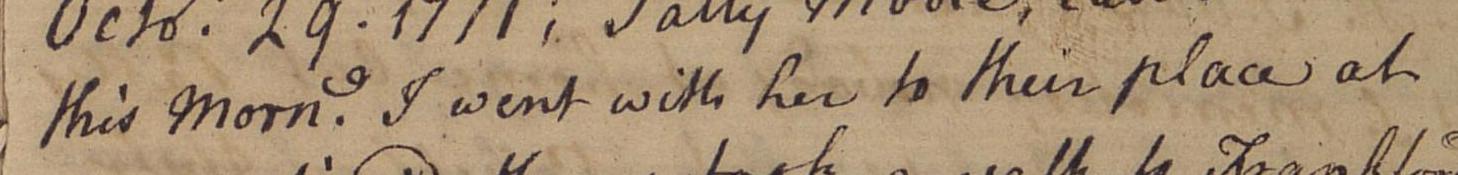this Morn^g. I went with her to their place at
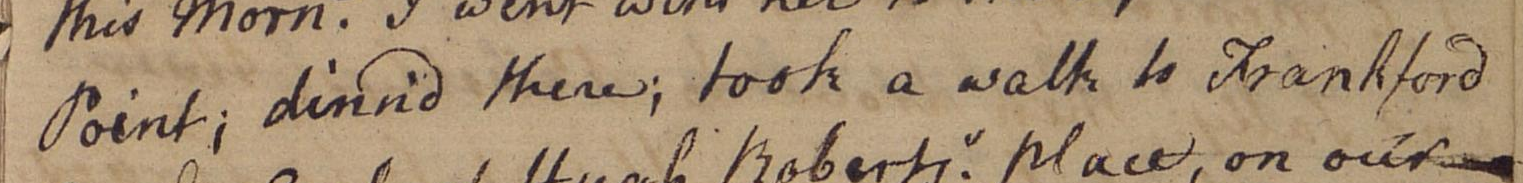Point; dinn'd there; took a walk to Frankford
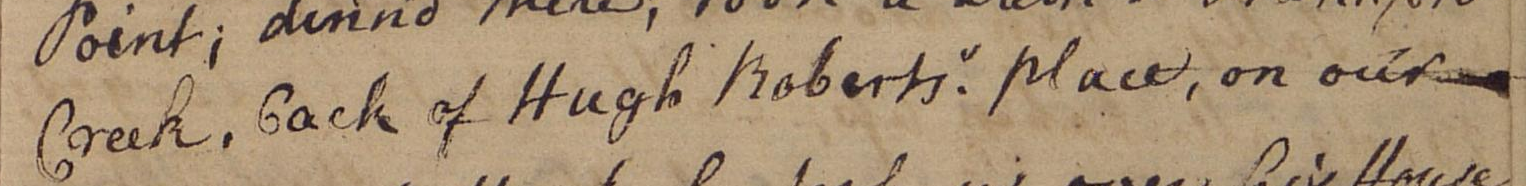Creek, back of Hugh Roberts^s. place, on our
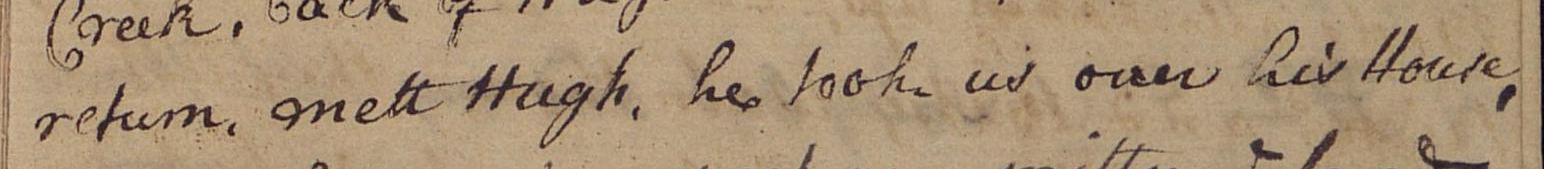return, mett Hugh, he took us our his House,
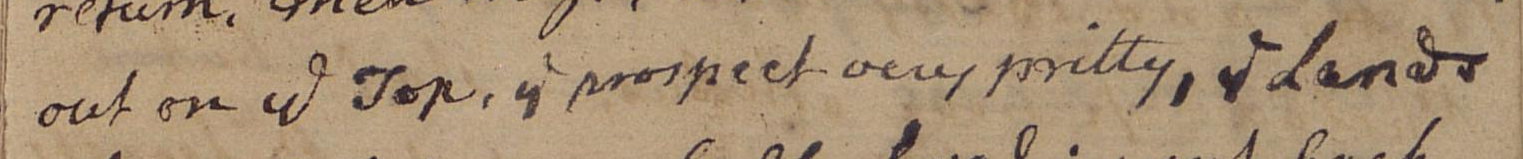out on y^e Top, y^e prospect very pritty, y^e Lands
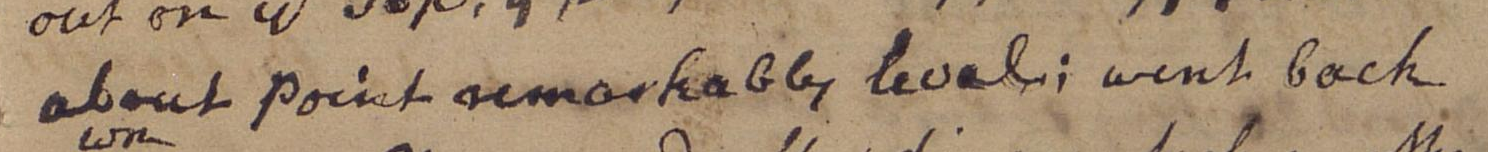about Point remarkably leval; went back
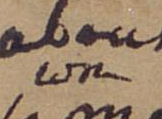Wm
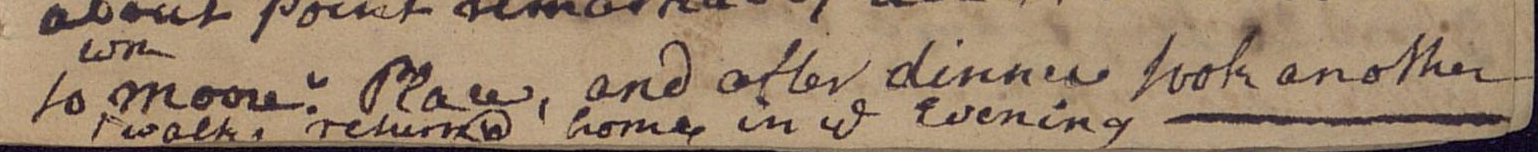to ^ Moore^s. Place, and after dinner took another
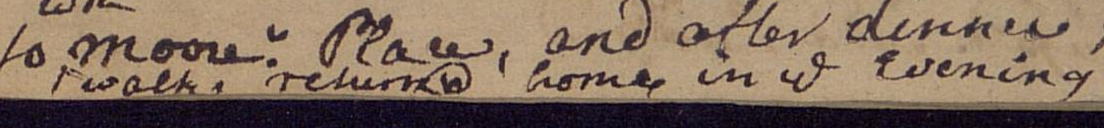walk return'd home in y^e Evening
